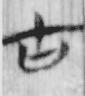古
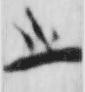之
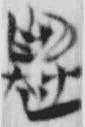○（舉）
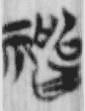禱
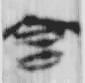宮
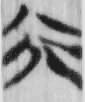行
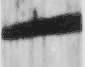一
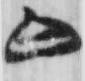白
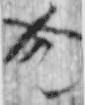犬
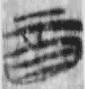酉
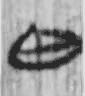甶（思）
